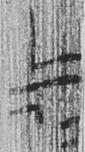上下
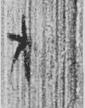相
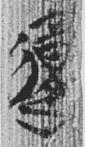○（復）
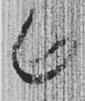㠯（以）
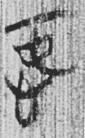忠
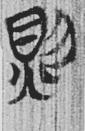則
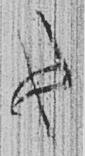民
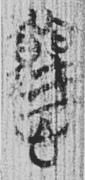懽（歡）
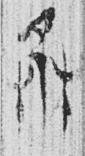丞（承）
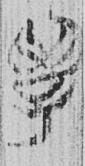○（學）
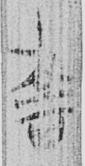害
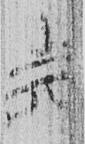者
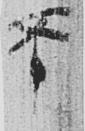不
